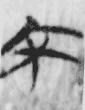宋
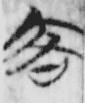客
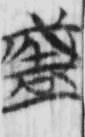盛
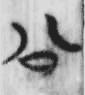公
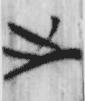之
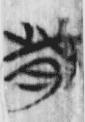歲（歲）
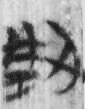○（荆）
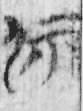𫵖
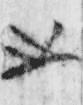之
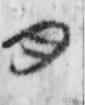月
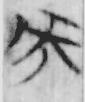癸
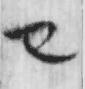巳
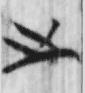之
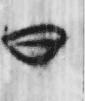日
